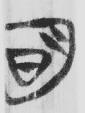明
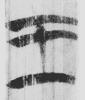王
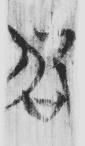卲
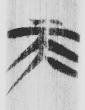天
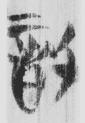信
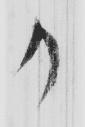人
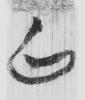㠯（以）
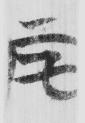厇
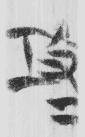攻=
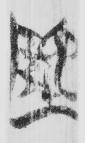地
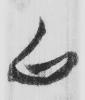㠯（以）
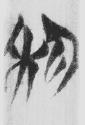利
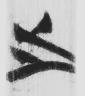之
